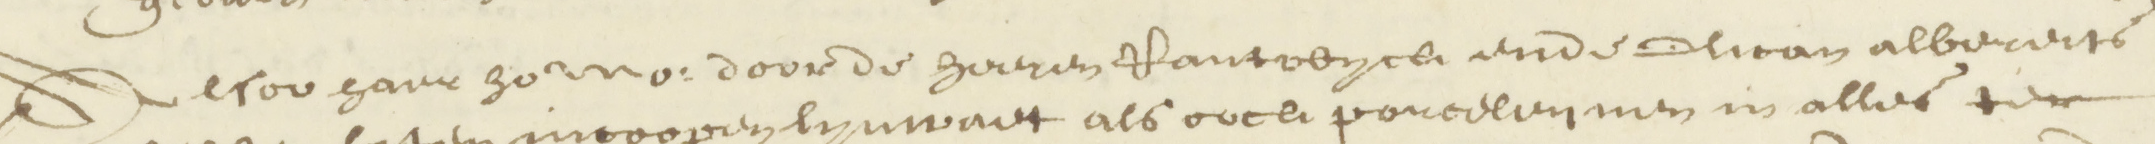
Alsoo haer ho:Mo: door de heeren Rantwyck ende Olican albereits
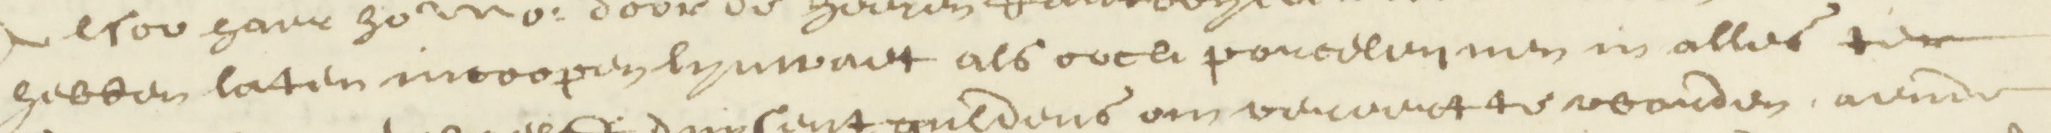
hebben laten incoopen lynwaet als oock porceleynen in alles ter
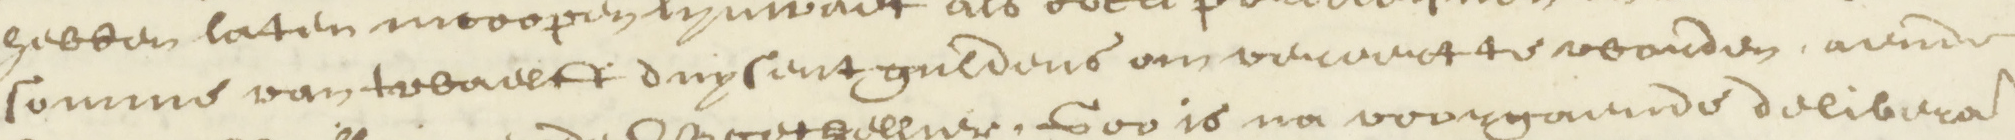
somme van twaelff duysent guldens om vereert te worden, aende
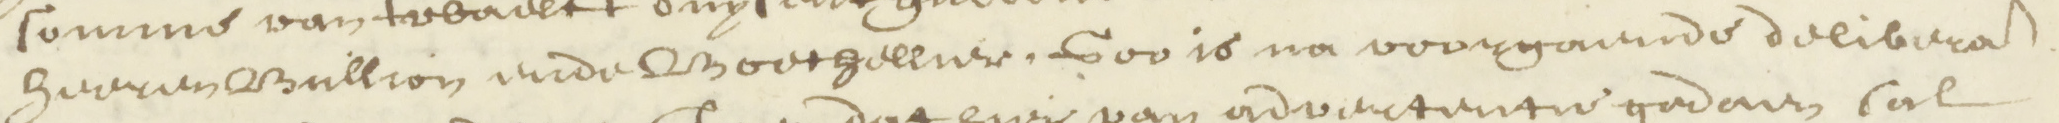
heeren Bullion ende Boethellier, Soo is na voorgaende delibera
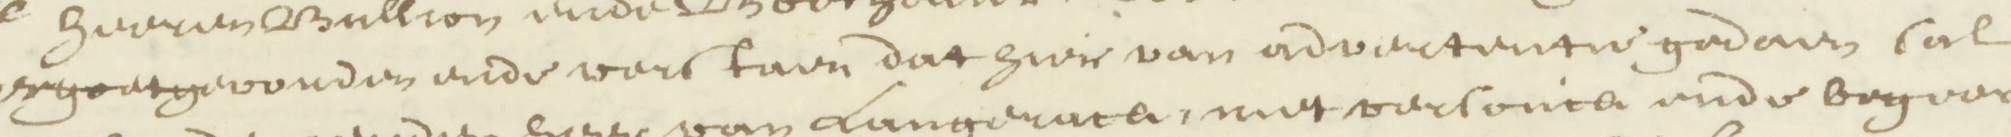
goetgevonden ende verstaen dat hier van advertentie gedaen sal
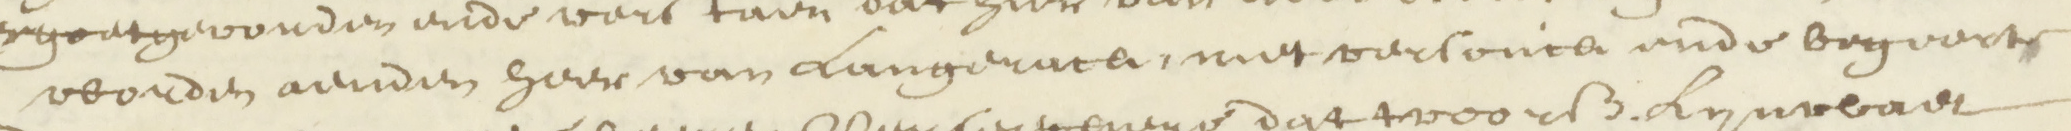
worden aenden heer van Langerack, met versouck ende begeert
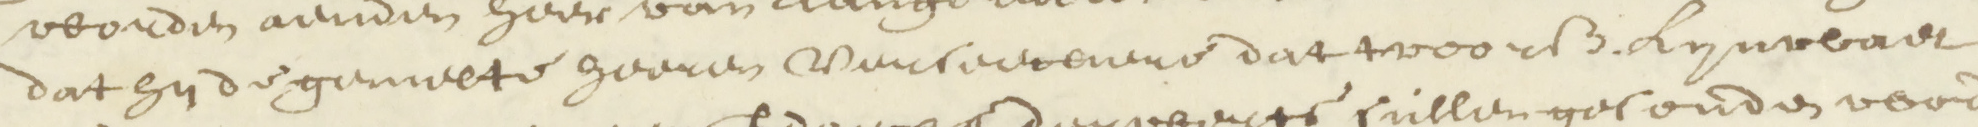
dat hy de gemelte heeren Verseeckere dat tvoors Lynwaet
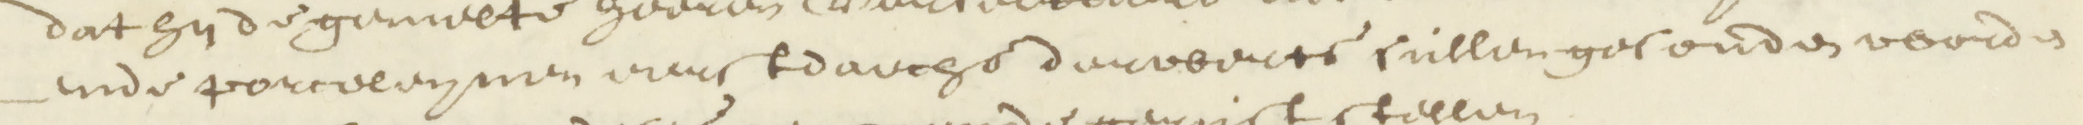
ende porcelynen eerstdaechs derwerts sullen gesonden worden
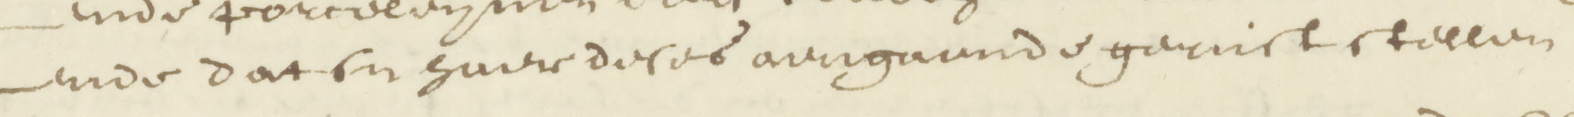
ende dat sy haer deses aengaende gerust stellen
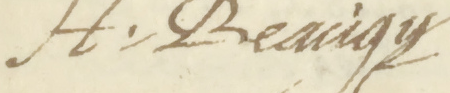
H. Beaugy
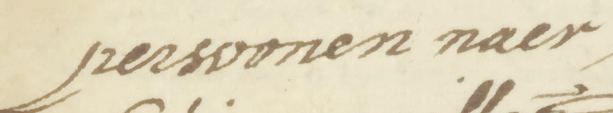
persoonen naer
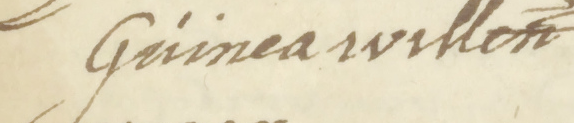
Guinea willen
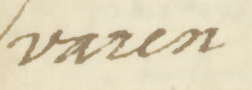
varen
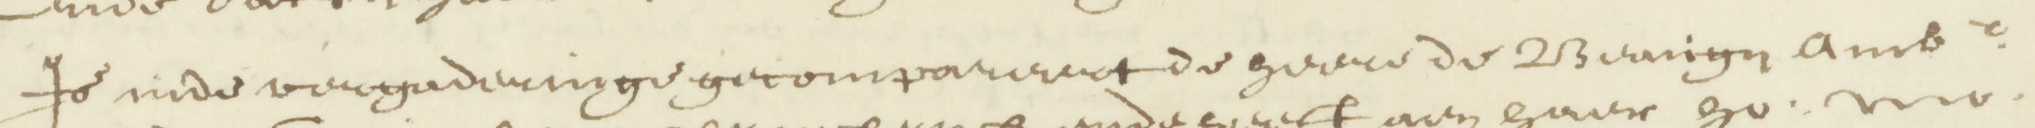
Is inde vergaderinge gecompareert de heere de Beaugy Ambr.
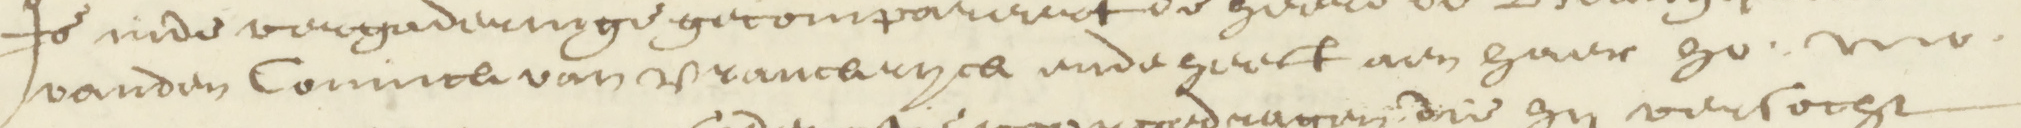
vanden Coninck van Vranckryck ende heeft aen haer ho:Mo:
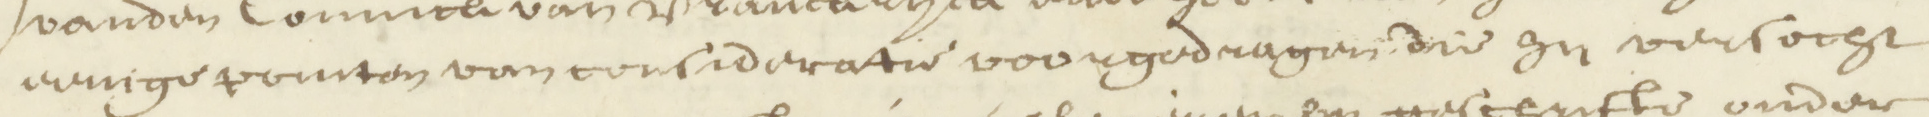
eenige pointen van consideratie voorgedragen die hy versocht
